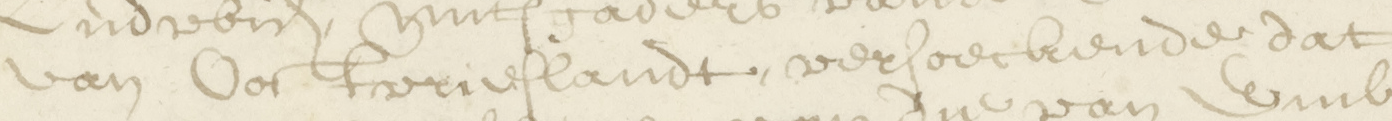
van Oostvrieslandt. versoeckende dat
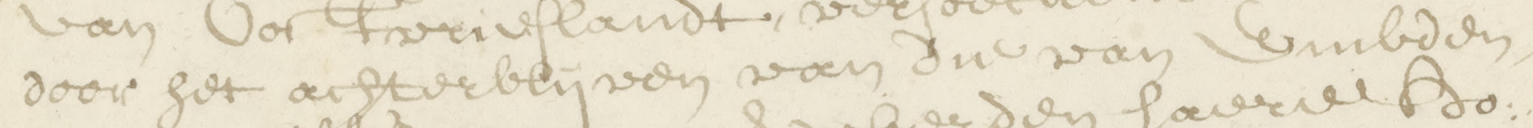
door het achterblijven van die van Embden,
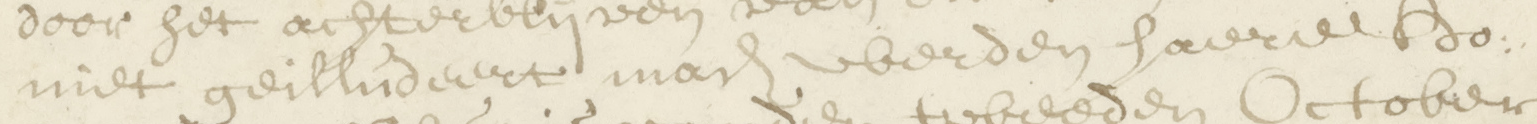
niet geilludeert mach worden haere Ho:
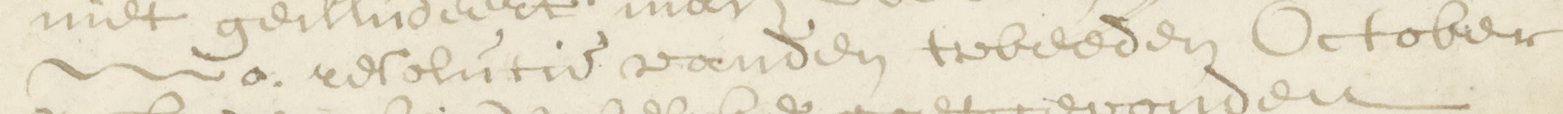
Mo: resolutie vanden tweeden October
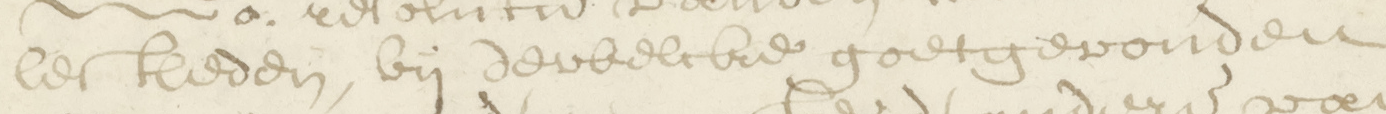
lestleden, bij dewelcke goetgevonden
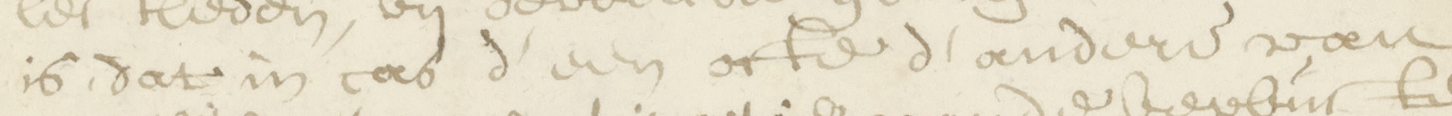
is, dat in cas d'een ofte d'andere van
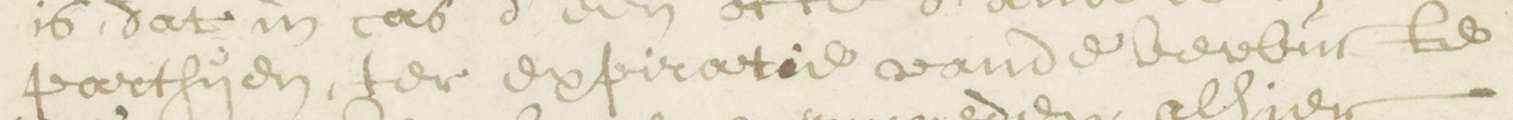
parthijen, ter expiratie vande bewuste
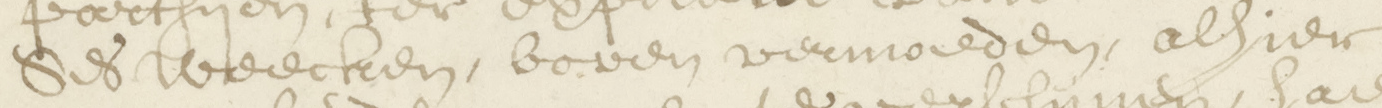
Ses weecken, boven vermoeden alhier
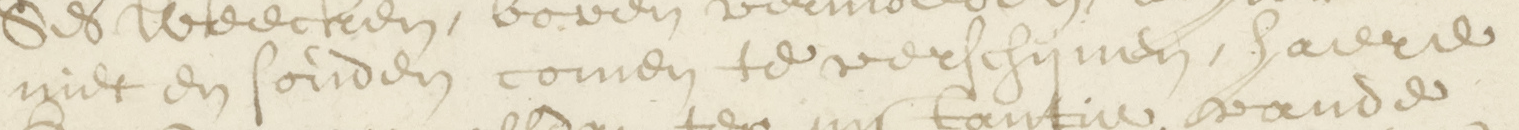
niet en souden comen te verschijnen, haere
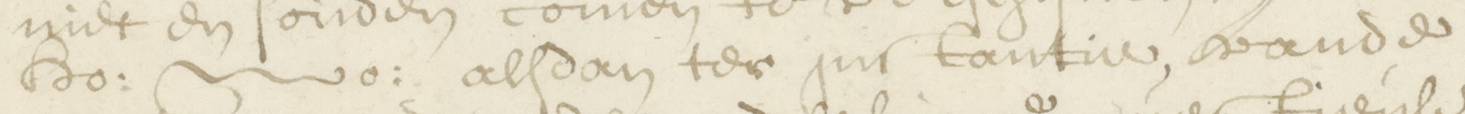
Ho:Mo: alsdan ter instantie vande
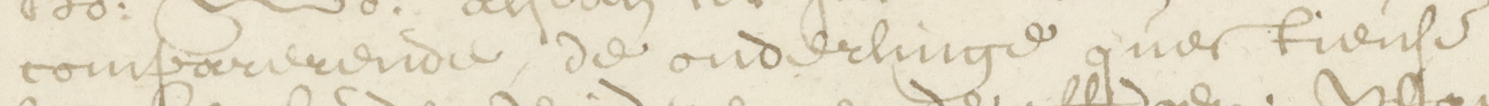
comparerende, de onderlinge questieuse
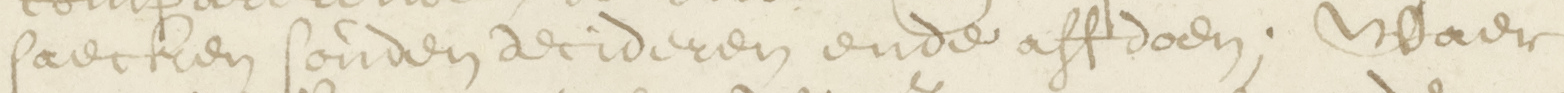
saecken souden decideren, ende affdoen; Waer
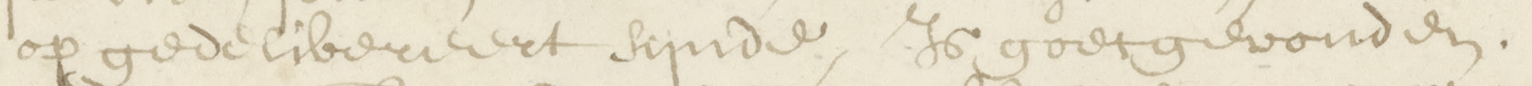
op gedelibereert sijnde, Is goetgevonden.
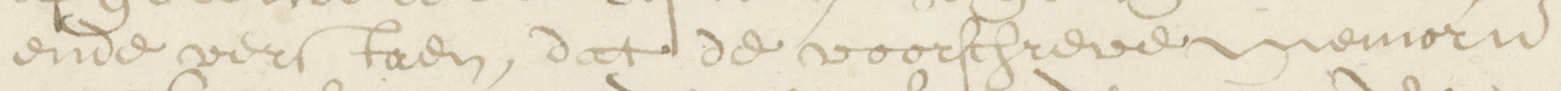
ende verstaen, dat de voorschreve memorie
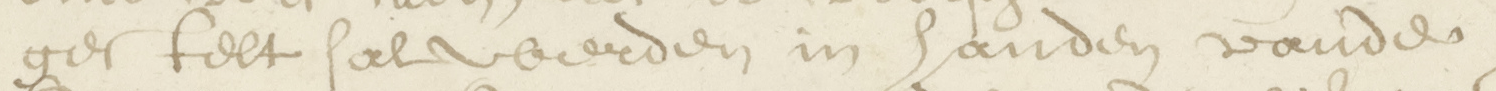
gestelt sal werden in handen vanden
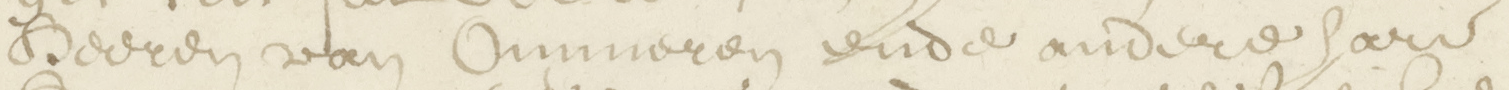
Heeren van Ommeren ende andere hare
